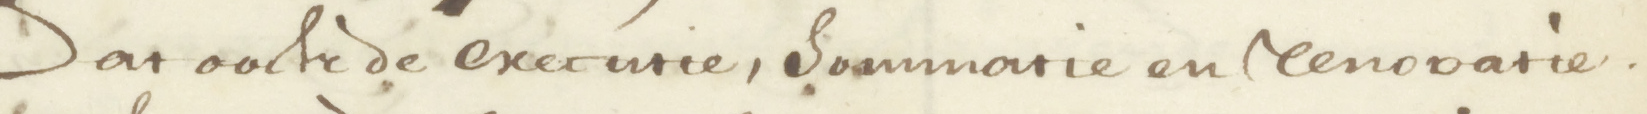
Dat oock de executie, Sommatie en renovatie
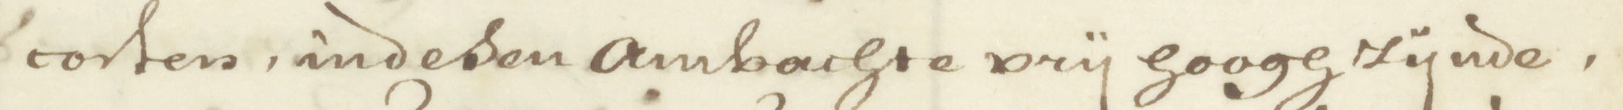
costen, in desen ambachte vrij hoogh zijnde,
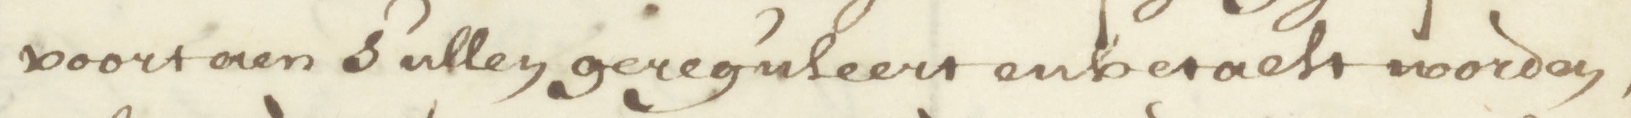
voortaen sullen gereguleert en betaelt worden,
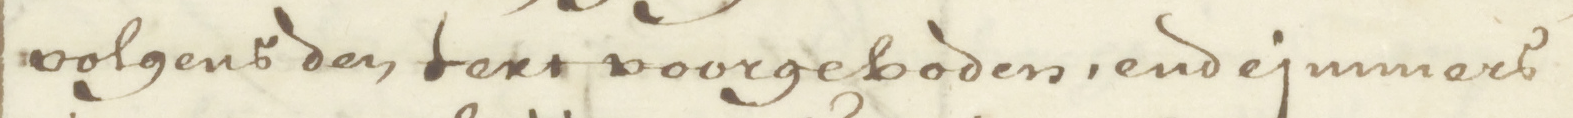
volgens den tert voorgeboden, ende immers
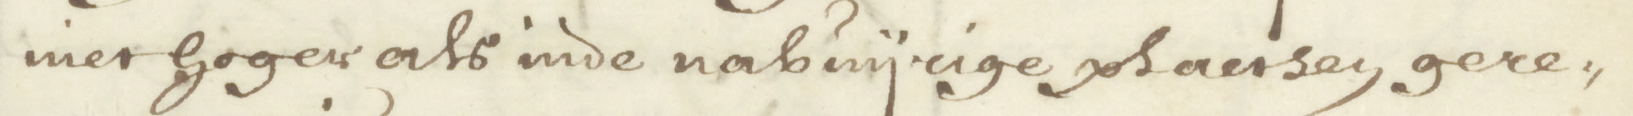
niet hoger als inde nabuijrige plaetsen gere„
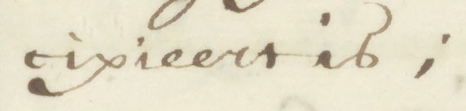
cipieert is.
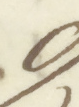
8.
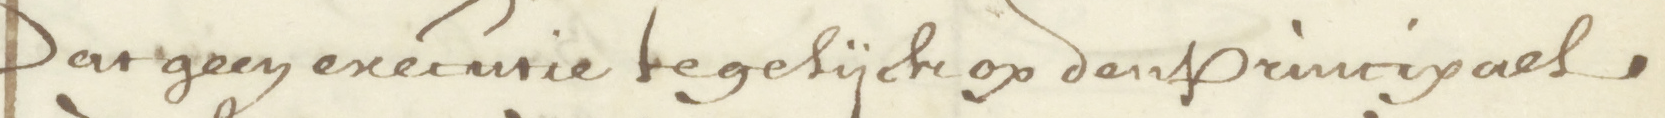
Dat geen executie te gelijck op den Principael
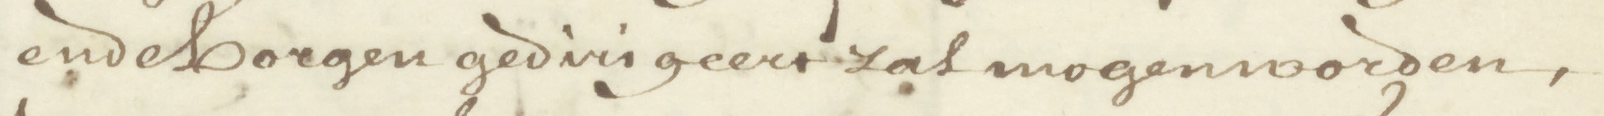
ende Borgen gedirigeert zal mogen worden,
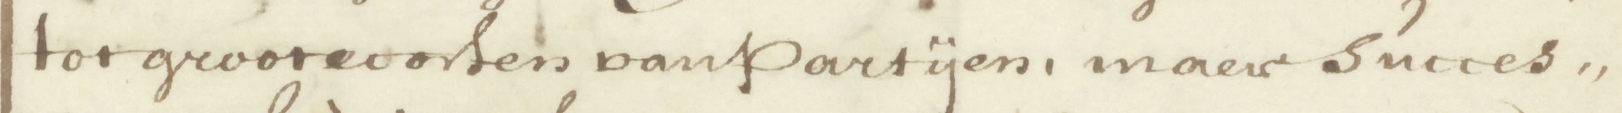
tot groote costen van Partijen, maer succes„
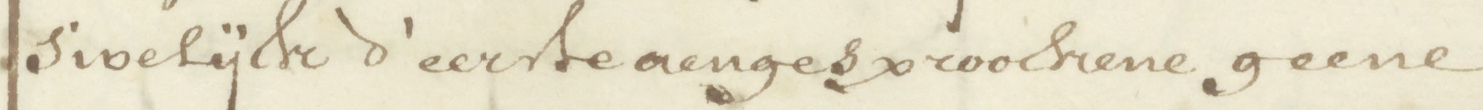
sivelijck d‛ eerste aengesproockene geene
